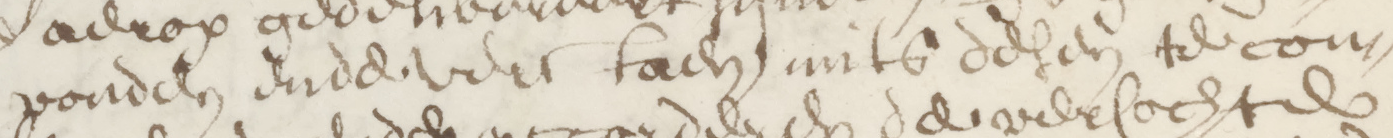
vonden ende verstaen, mits desen te con„
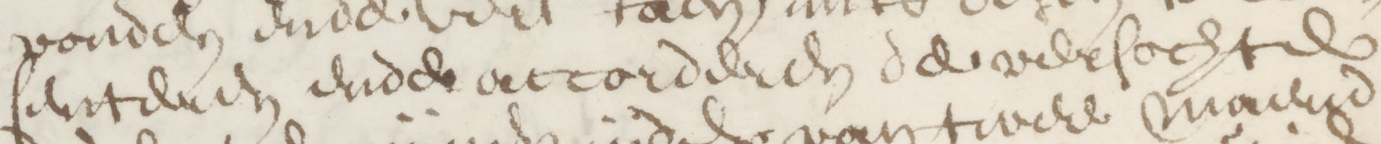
senteren ende accorderen de versochte
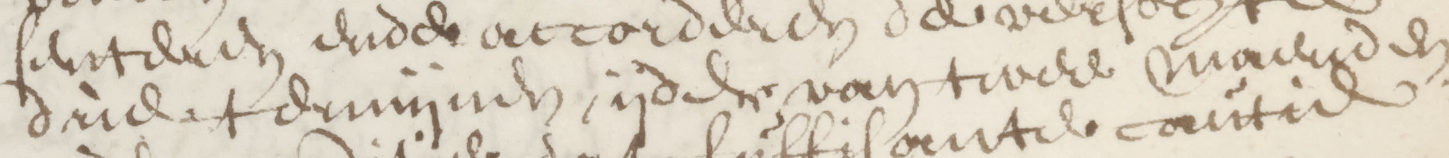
drie termijnen, ijder van twee maenden,
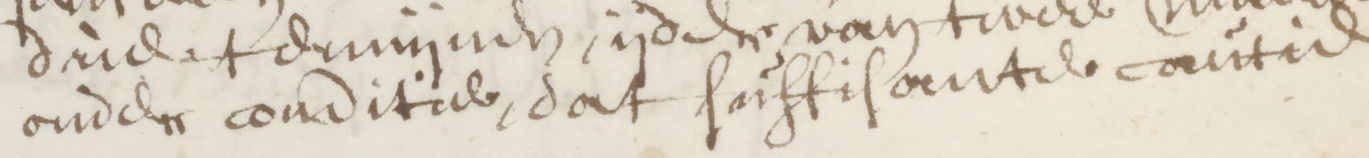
onder conditie, dat suffisante cautie
